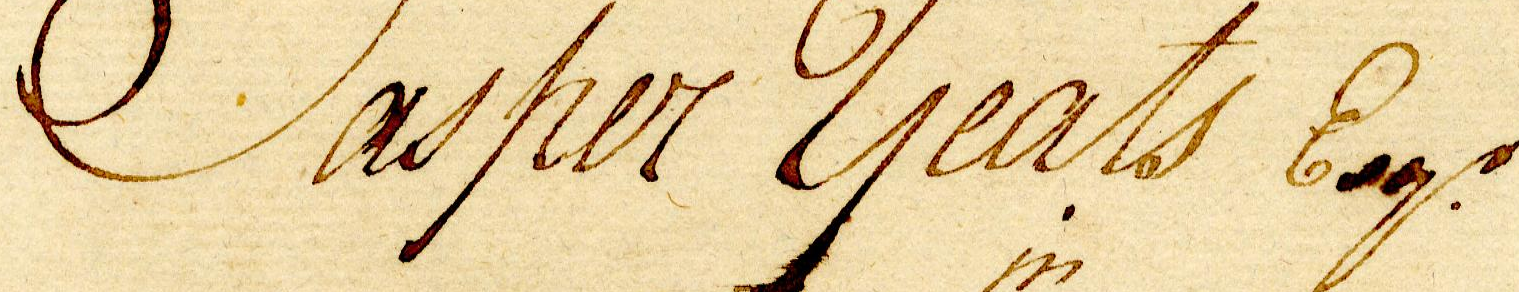Jasper Yeates Esq^r
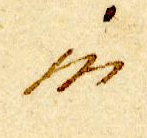in
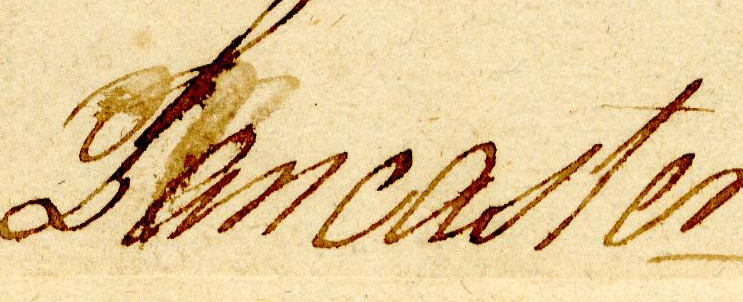Lancaster
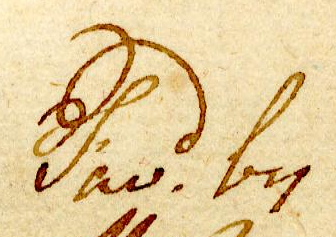Fav^d by
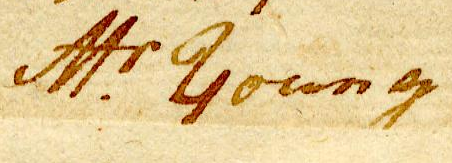M^r. Young
